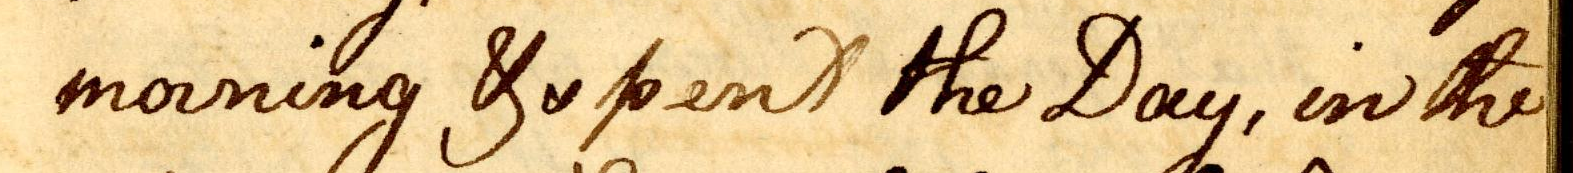morning & spent the Day, in the
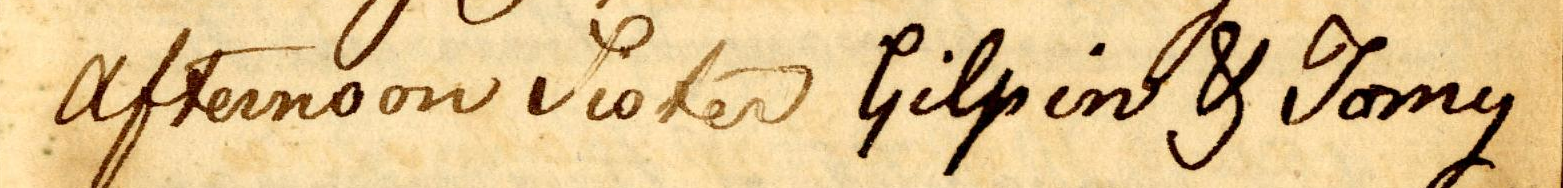Afternoon Sister Gilpin & Tomy
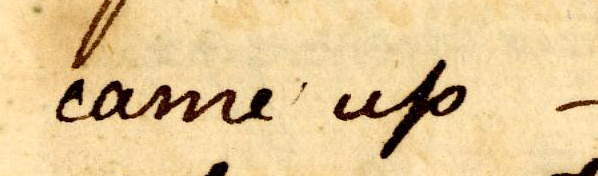came up-
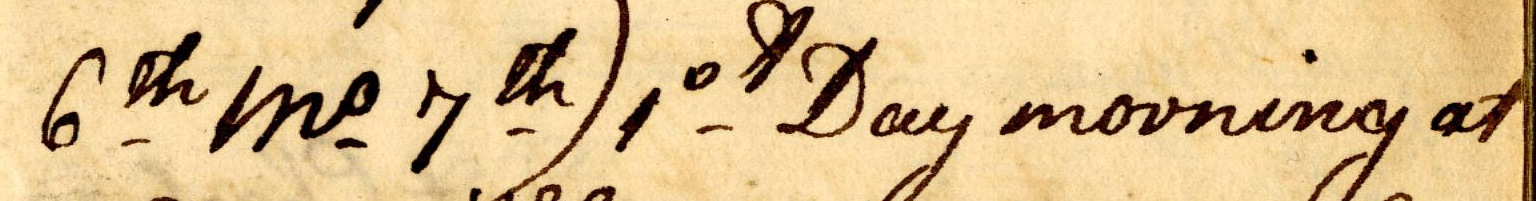6^th M^o 7^th ) 1^st Day morning at
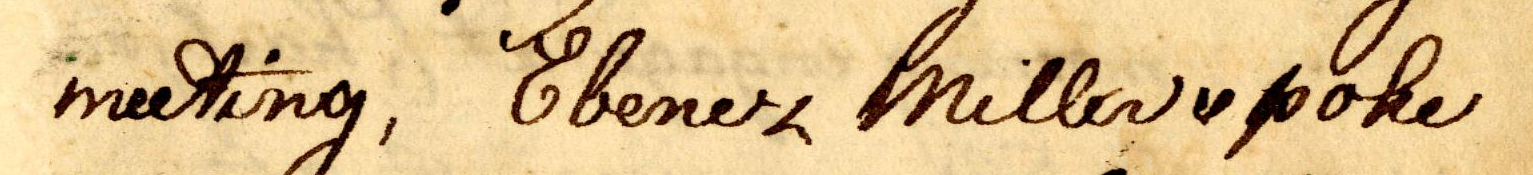meeting, Ebenez Miller spoke
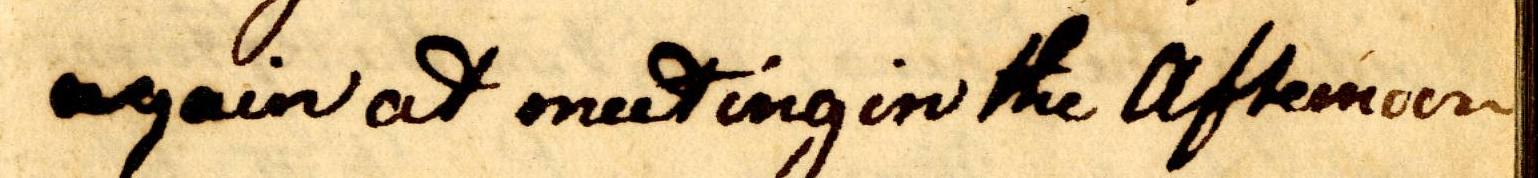again at meeting in the Afternoon
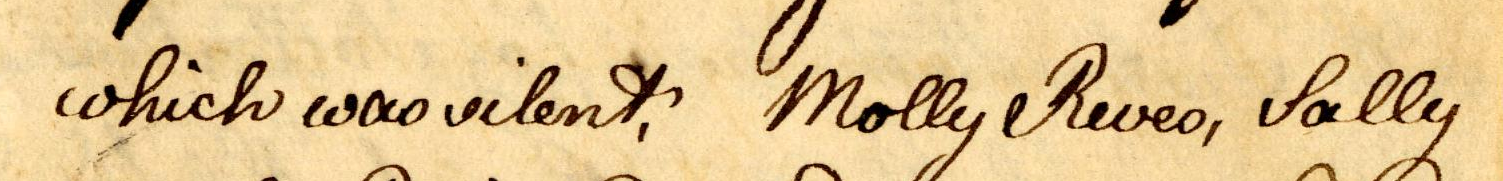which was silent, Molly Reves, Sally
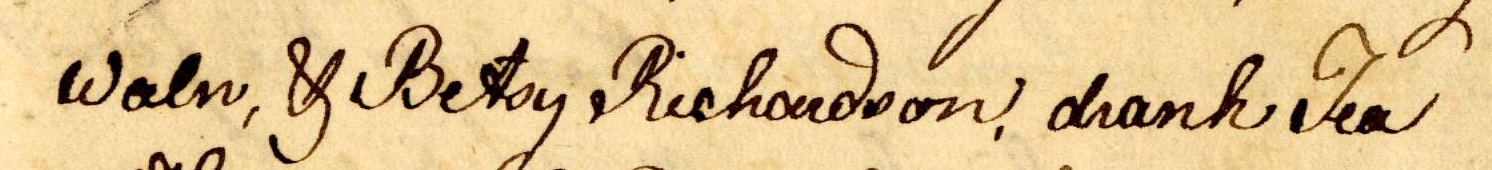Waln, & Betsy Richardson, drank Tea
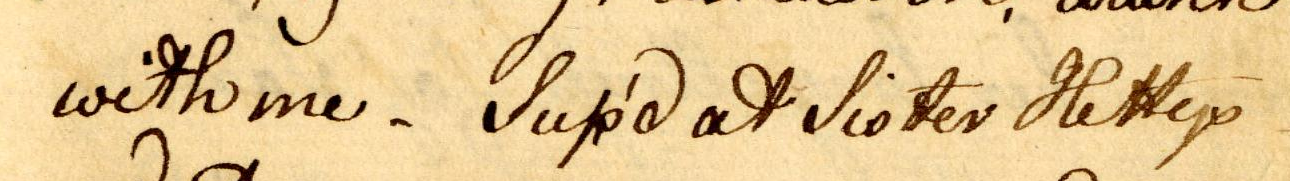with me. Sup'd at Sister Hettys
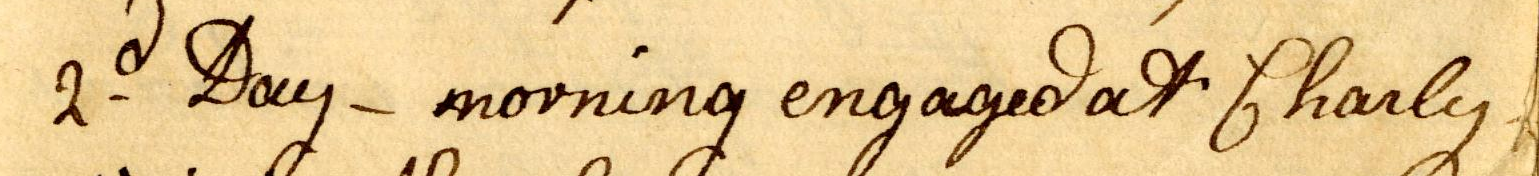2^d. Day- morning engaged at Charly
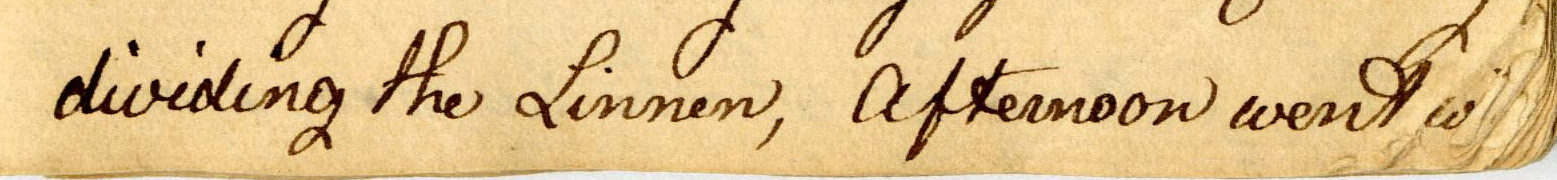dividing the Linnen, Afternoon went w
